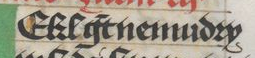Ekl ḡt nemudry
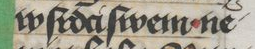w ſrdci ſwem.ne¬
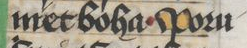met boha.Poru¬
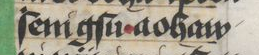ẛeni gſu.a ohaw¬
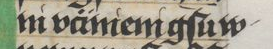ni vċínieni gſu w
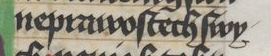neprawoſtech ſwy¬
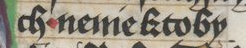ch.neníe ktoby
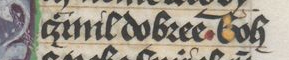cżinil dobree.Boh
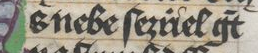s nebe ſezṙiel ḡt
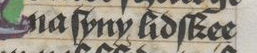na ſyny lidſkee
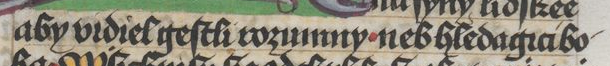aby vidiel geſtli rozumny.neb hledagicí bo¬
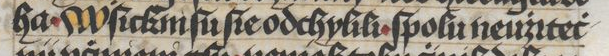ha.Wẛickniſu ſie odchylili.ſpolu neużiteċ¬
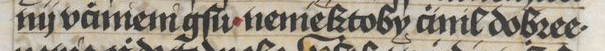nij vċinieni gſu.neniektoby ċínil dobree.
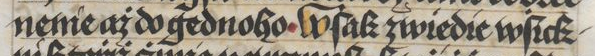nenie až do gednoho.Wẛak zwiedíe wẛick¬
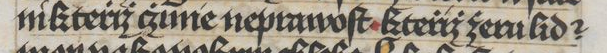ni kteṙiż cżiníe neprawoſt.kteṙíż żeru lid?
